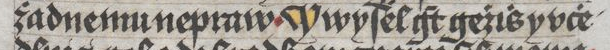żadnemu nepraw.Y wyẛel ḡt geżíṡ y vċe¬
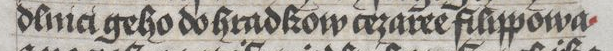dlnici geho do hradkow cezáree filippowa.
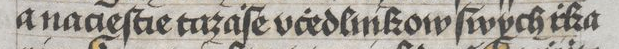a nacieſtie tazaẛe vċedlníkow ſwych ṙka
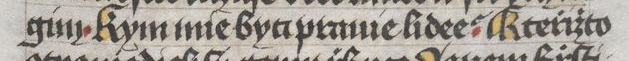gím.Kym mie byti prauíe lidee?Kteṙíżto
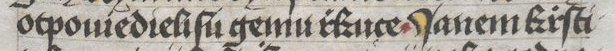otpouiedieli ſu gemu řkuce.ianem kṙſti¬
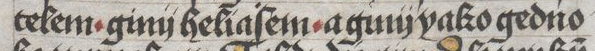telem.ginij heliaẛem.a ginij yako gedno¬
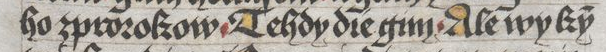ho zprorokow.Tehdy díe gim.Ale wy kȳ
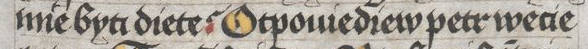mie byti díete?Otpouiediew petr wecie
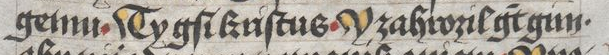gemu.Ty gſi kriſtus.Y zahrozil ḡt gím.
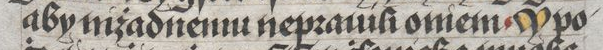aby niżadnemu nepraulili oniem.Y po¬
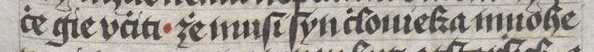ċe gie vċiti.że muſi ſyn ċlouieka mnohe
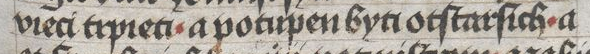vieci trpieti.a potupen byti otſtarẛich.a
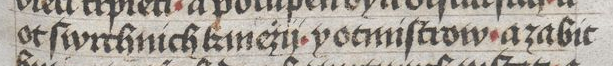ot ſwrchních knieżij.y ot míſtrow.a zabít
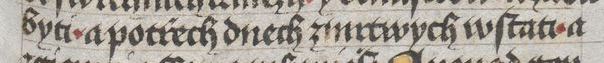byti.a potřech dnech zmrtrych wſtati.a
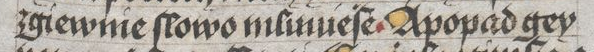zgiewnie ſlowo mluuíeẛe.A popad gey
